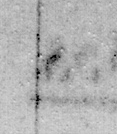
so¬
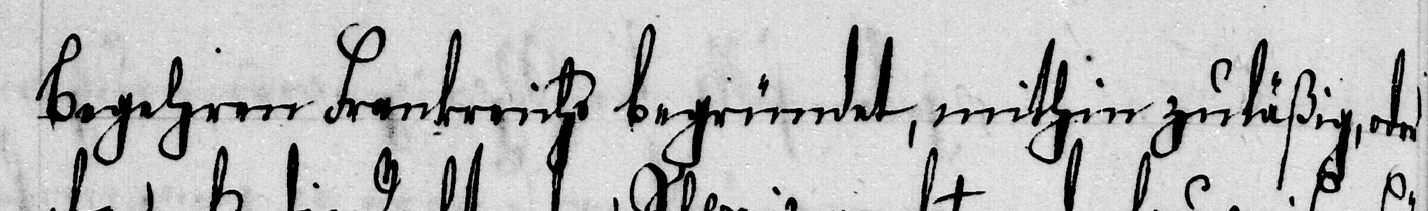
Begehren Frankreichs begründet, mithin zuläßig,
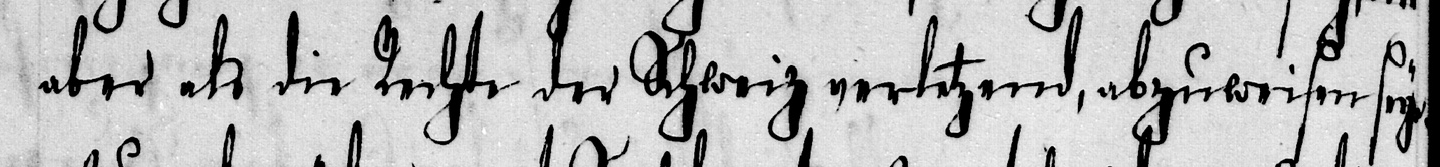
aber als die Rechte der Schweiz verletzend, abzuweisen sey.
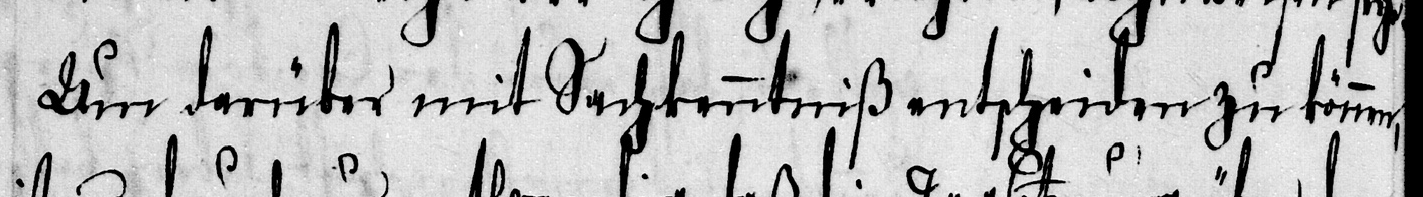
Um darüber mit Sachkenntniß entscheiden zu könn¬
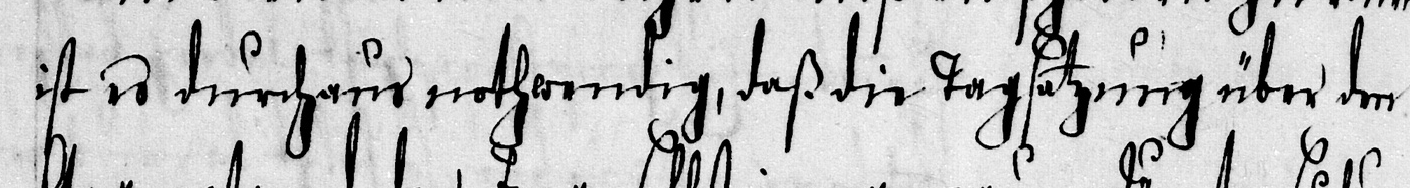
ist es durchaus nothwendig, daß die Tagsatzung über den
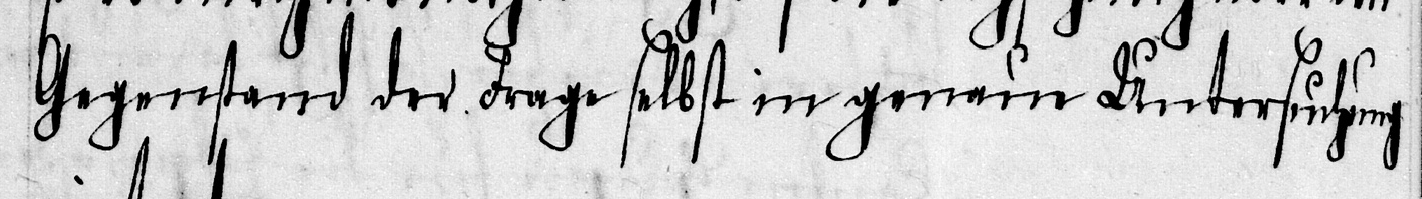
Gegenstand der Frage selbst in genaue Untersuchung
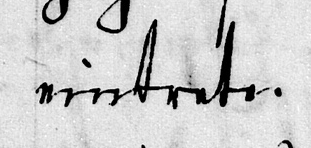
eintrete.
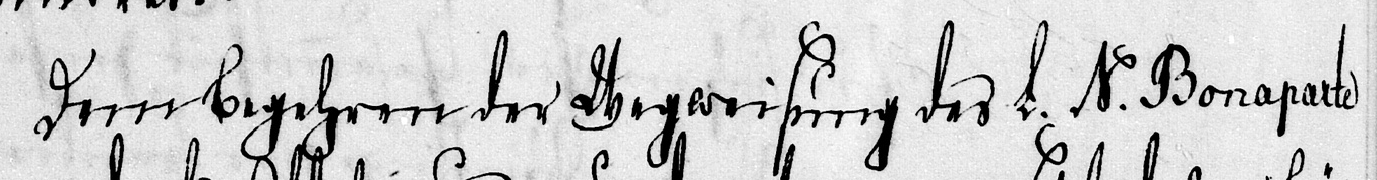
Dem Begehren der Wegweisung des L. N. Bonaparte
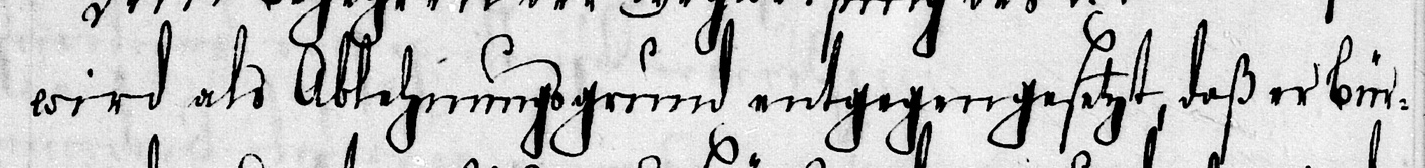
wird als Ablehnungsgrund entgegengesetzt, daß er Bür¬
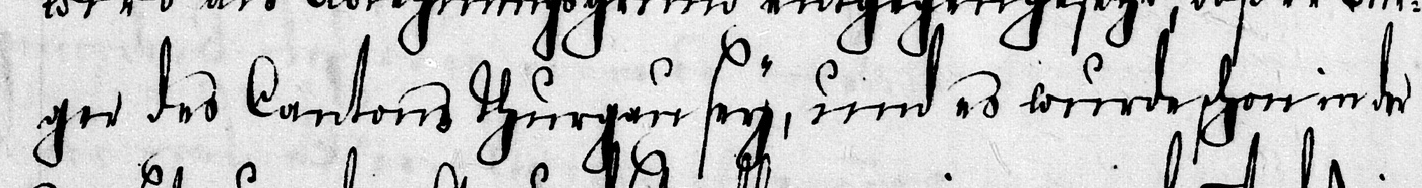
ger des Cantons Thurgau sey, und es wurde schon in d¬
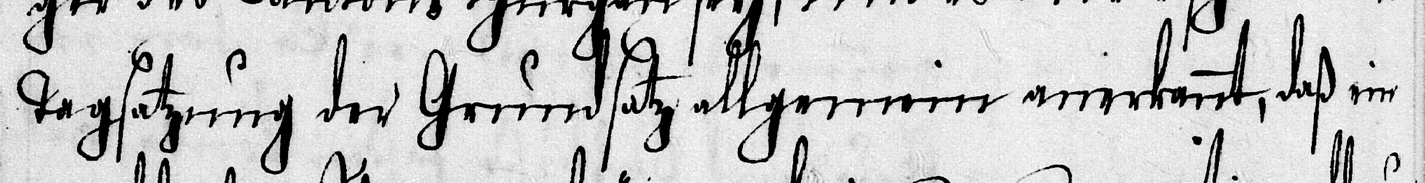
Tagsatzung der Grundsatz allgemein anerkannt, daß e¬
